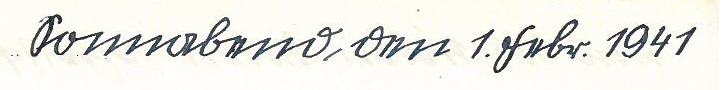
Sonnabend, den 1. Febr. 1941
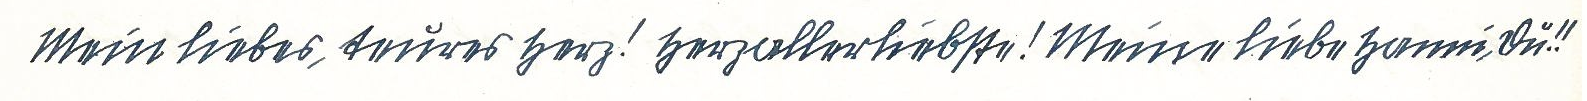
Mein liebes, teures Herz! Herzallerliebste! Meine liebe, Du!!
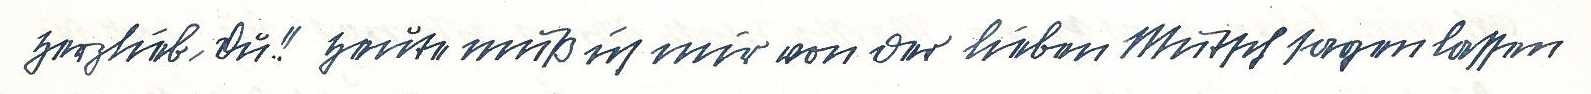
Herzlieb, Du!! Heute muß ich mir von der lieben Mutsch sagen lassen und
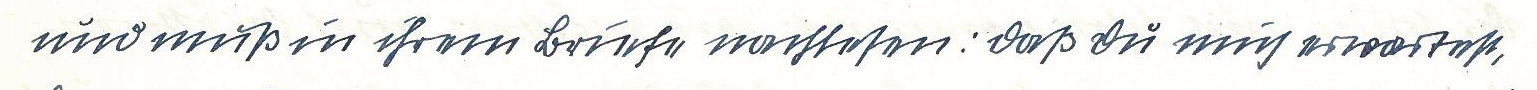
muß in ihrem Briefe nachlesen: daß Du mich erwartest,
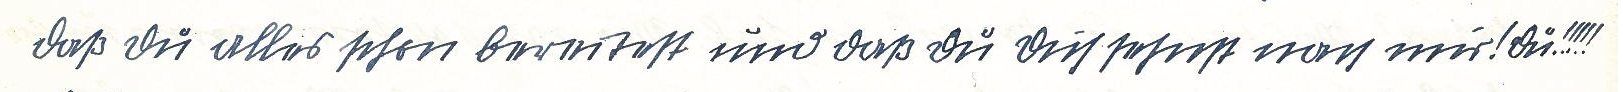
daß Du alles schon bereitest und daß Du Dich sehnst nach mir! Du!!!!!
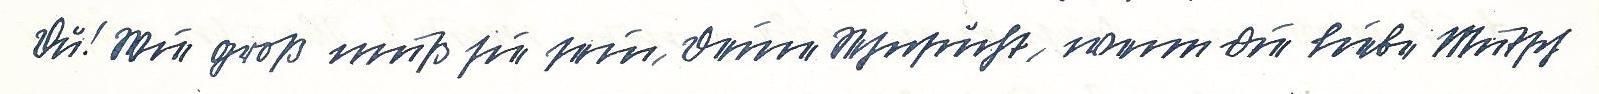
Du! Wie groß muß sie sein, Deine Sehnsucht, wenn die liebe Mutsch
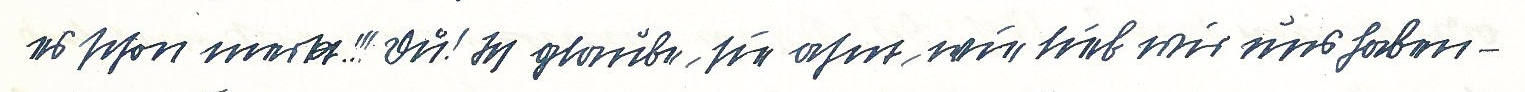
es schon merkt!!! Du! Ich glaube, sie ahnt, wie lieb wir uns haben –
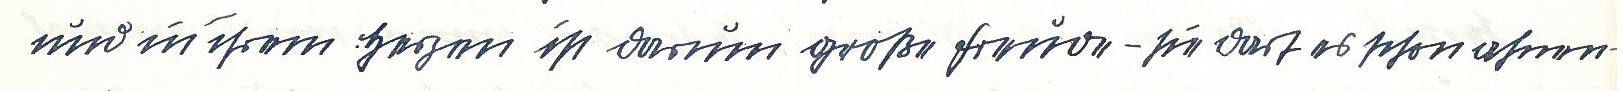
und in ihrem Herzen ist darum große Freude – sie darf es schon ahnen –
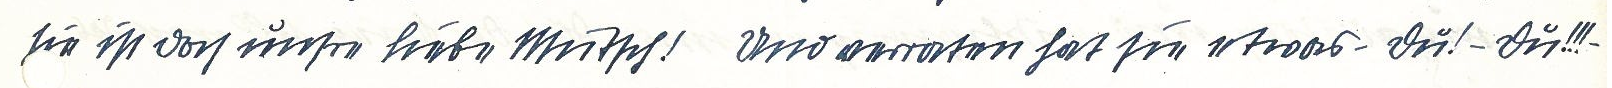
sie ist doch unsre liebe Mutsch! Und verraten hat sie etwas – Du! – Du!! –
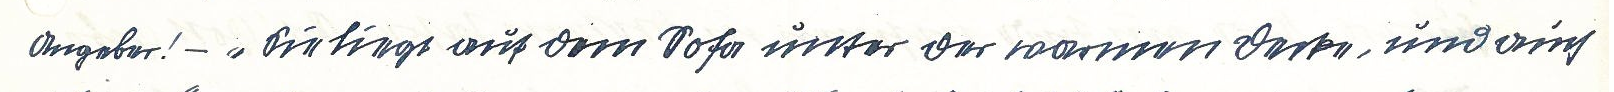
Angeber! – „Sie liegt auf dem Sofa unter der warmen Decke, und auch
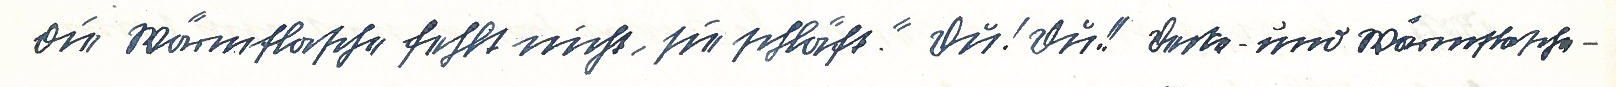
die Wärmflasche fehlt nicht, sie schläft.” Du! Du!! Decke – und Wärmflasche –
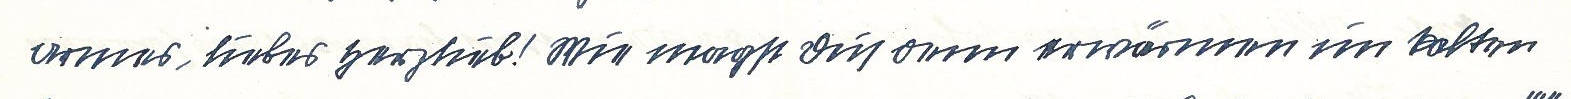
armes, liebes Herzlieb! Wie magst Dich denn erwärmen im kalten
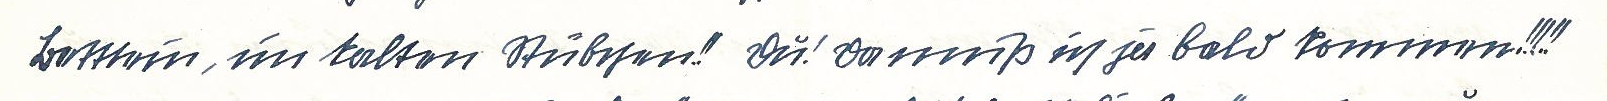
Bettlein, im kalten Stübchen!! Du! Da muß ich ja bald kommen!!!!!
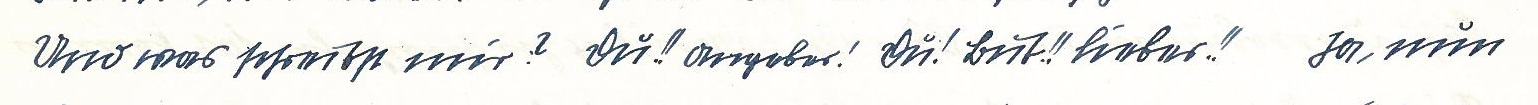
Und was schreibst mir? Du! Angeber! Du! Bub!! liebes!! Ja, nun
